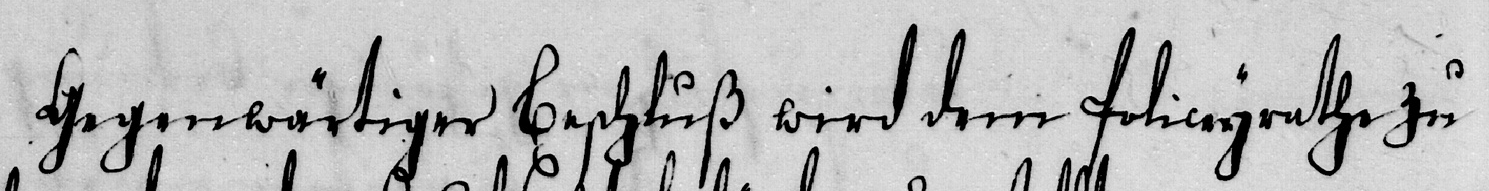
Gegenwärtiger Beschluß wird dem Policeyrathe zu
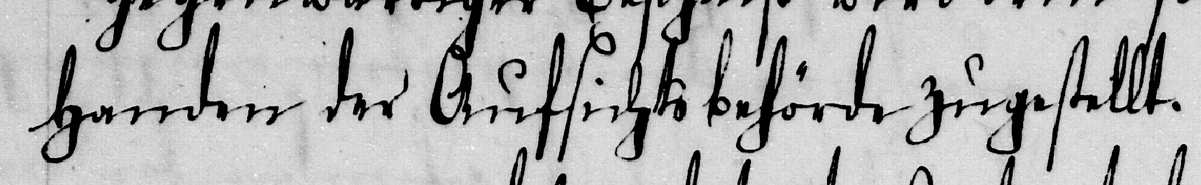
Handen der Aufsichtsbehörde zugestellt.
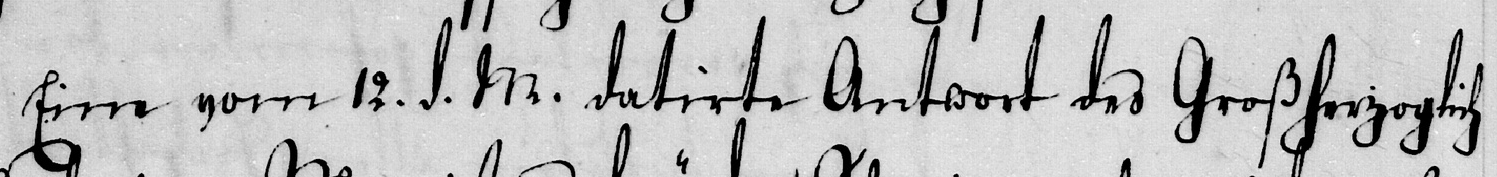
Eine vom 12. d. M. datirte Antwort des Großherzoglich
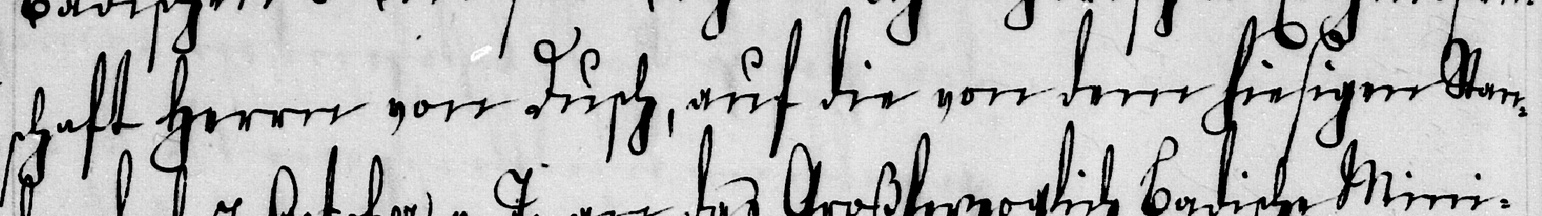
chaft Herrn von Dusch, auf die von dem hiesigen Stan¬
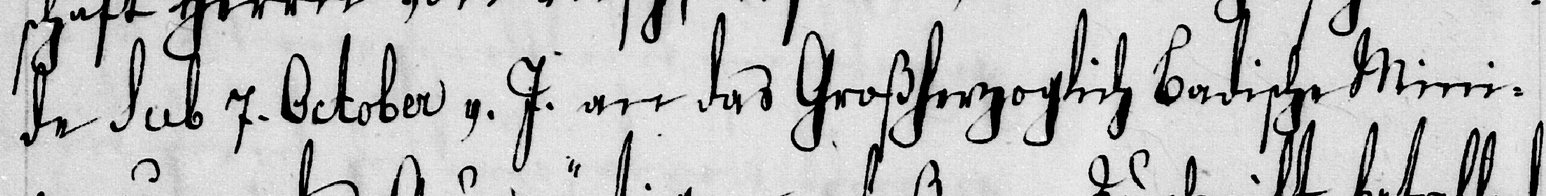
de sub 7. October v. J. an das Großherzoglich Badische Mini¬
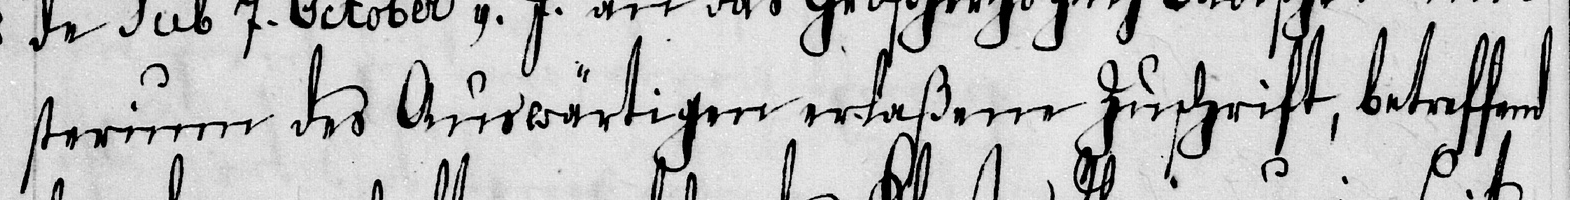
sterium des Auswärtigen erlaßene Zuschrift, betreffe¬
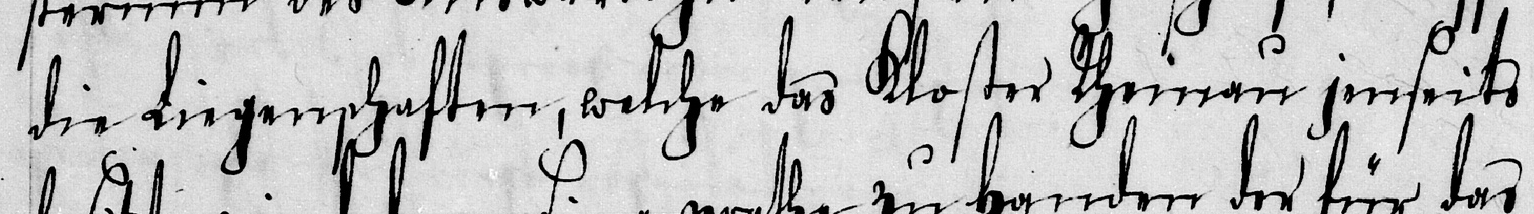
die Liegenschaften, welche das Kloster Rheinau jenseits
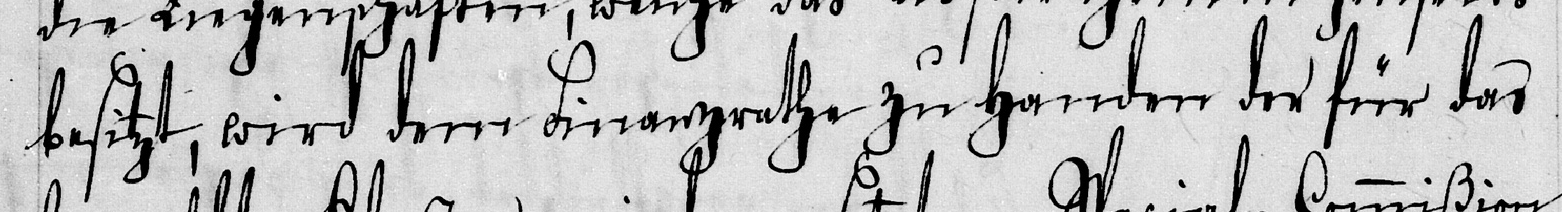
besitzt, wird dem Finanzrathe zu Handen der für das
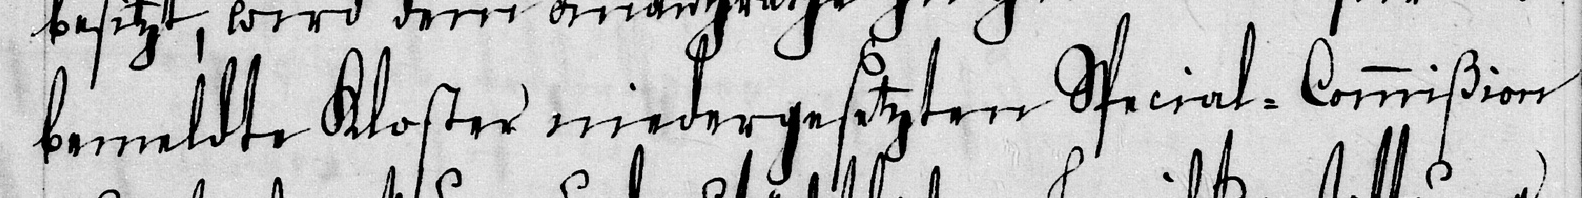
bemeldte Kloster niedergesetzten Special-Commißion
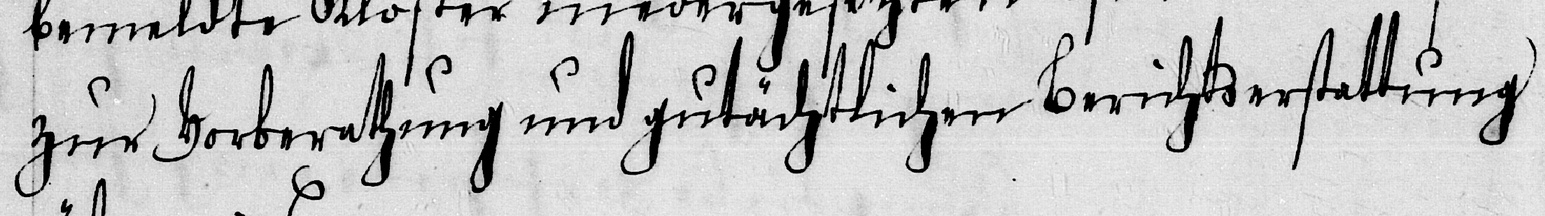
zur Vorberathung und gutächtlichen Berichterstattung
